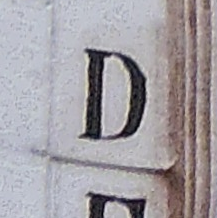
D
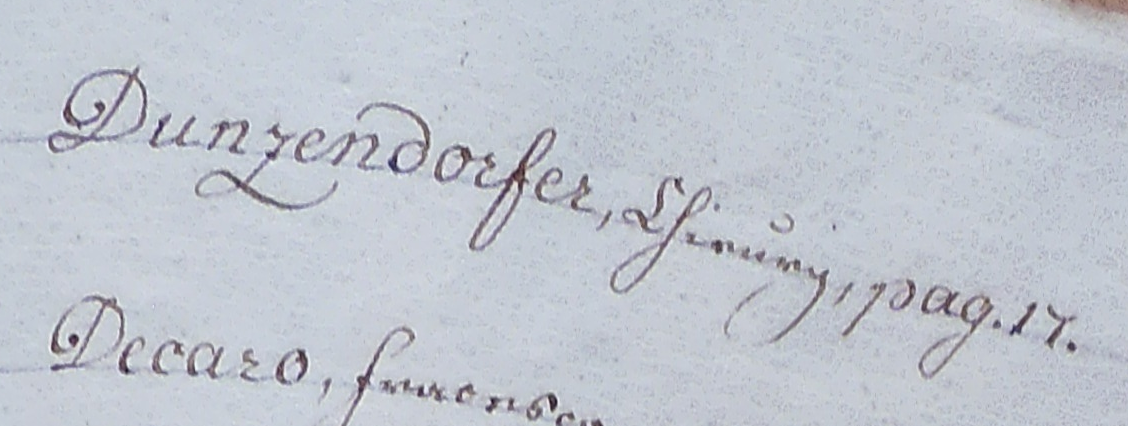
Dunzendofer, Chirurg, pag. 17.
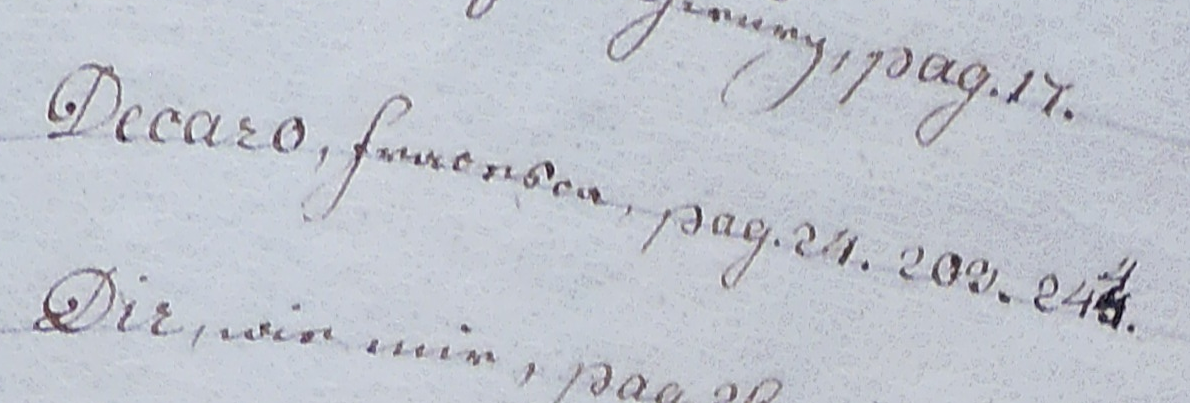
Decaro, Fracesca, pag. 24. 203. 244.
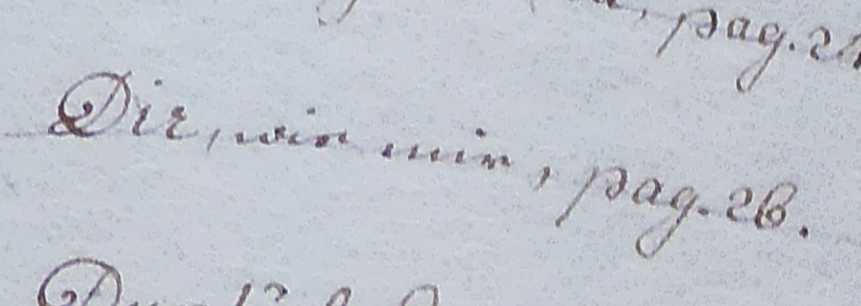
Dir, wir mir, pag. 26.
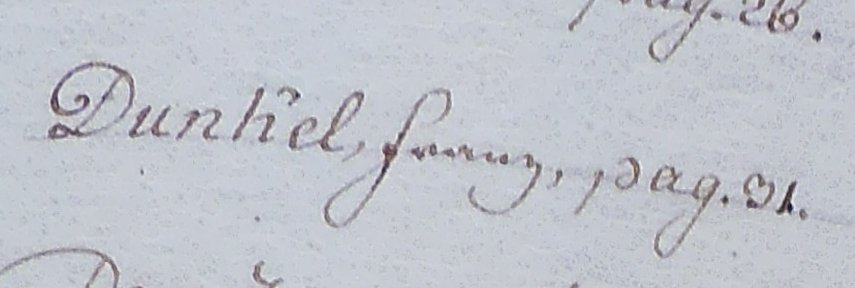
Dunkel, Franz, pag 31.
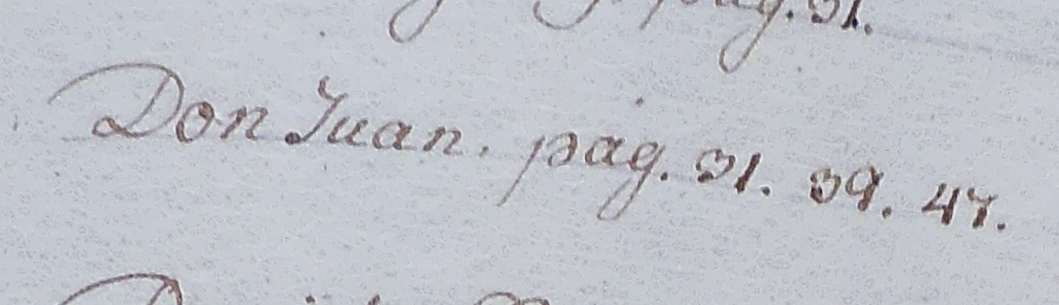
Don Juan, pag. 31. 39. 47.
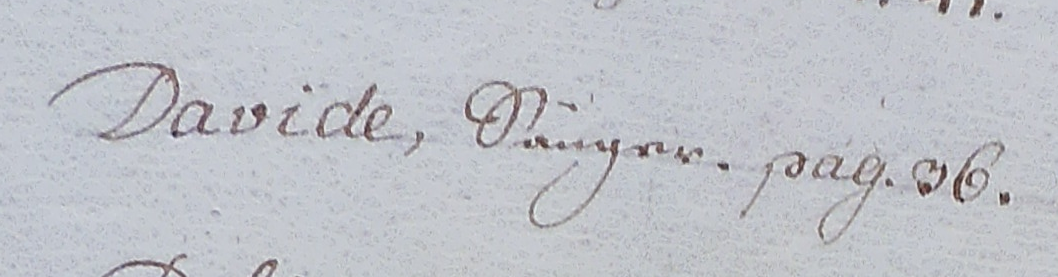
Davide, Sänger. pag. 36.
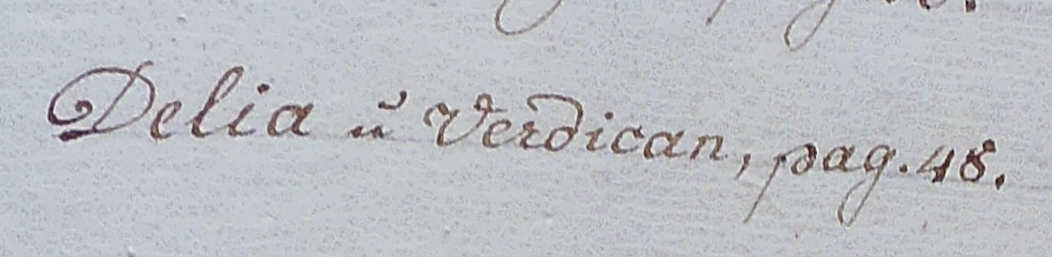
Delia u Verdican, pag.48.
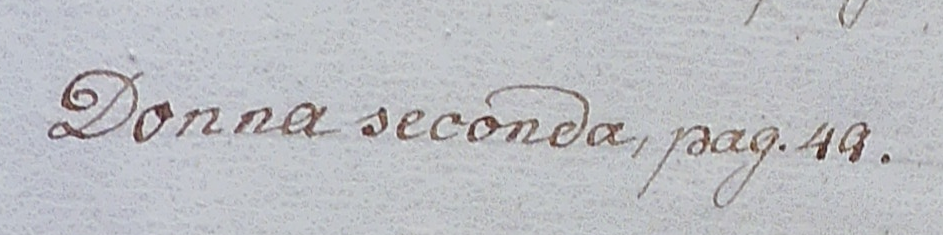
Donna seconda, pag.49.
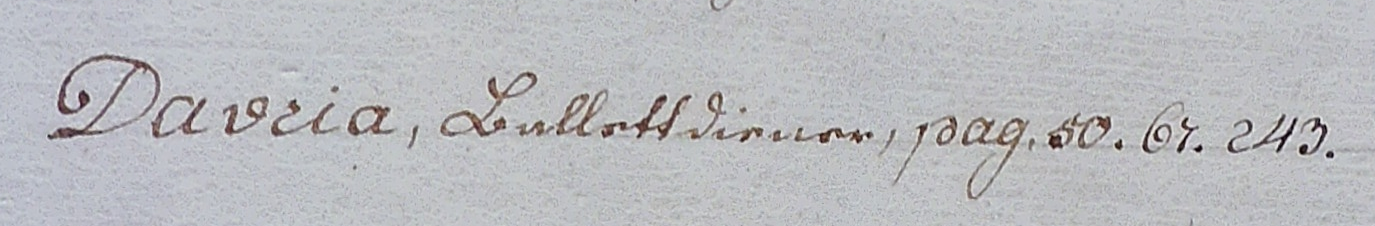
Davria, Ballettdiener, pag. 50. 67. 243.
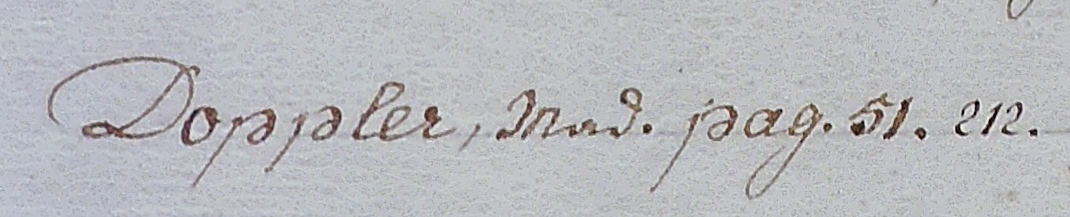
Doppler, Mad. pag. 51. 212.
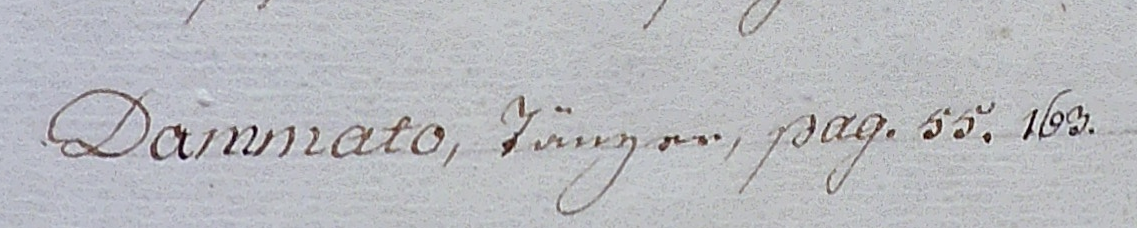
Dammato, Tänzer, pag. 55. 163.
